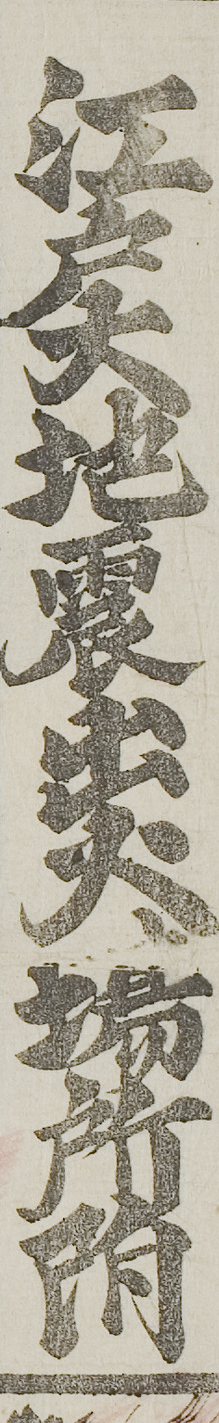江戸大地震出火場所附
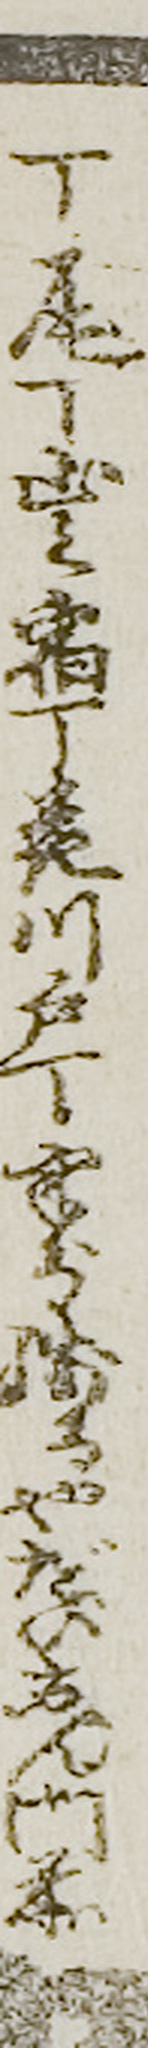丁瓦丁山之宿丁花川戸丁半分残るやだいしん門前
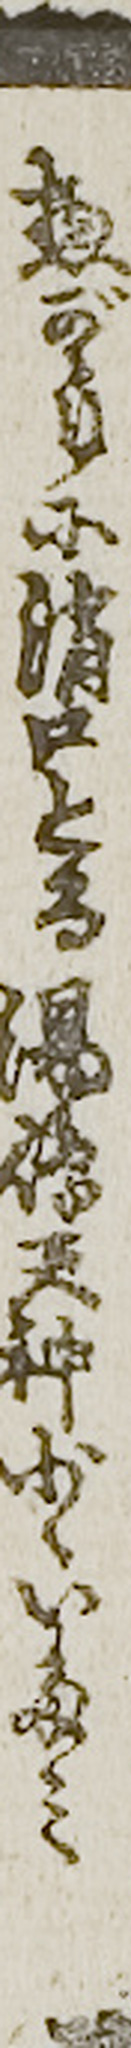惣がゝりに消口とる湯嶋天神少々いたミ
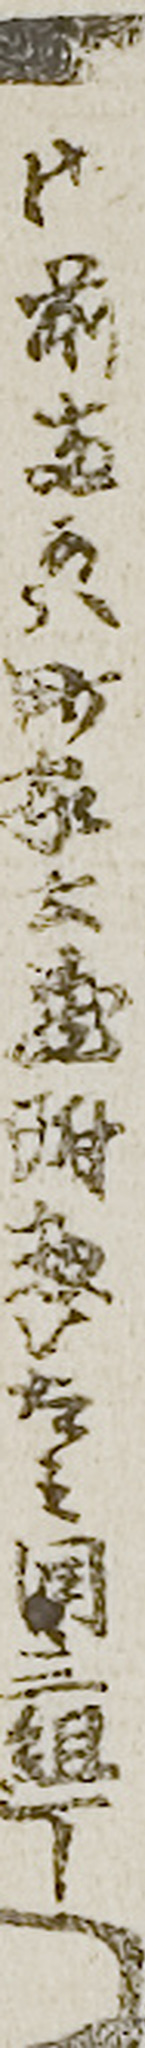門前両かハ町家土蔵附惣いたミ同三組丁
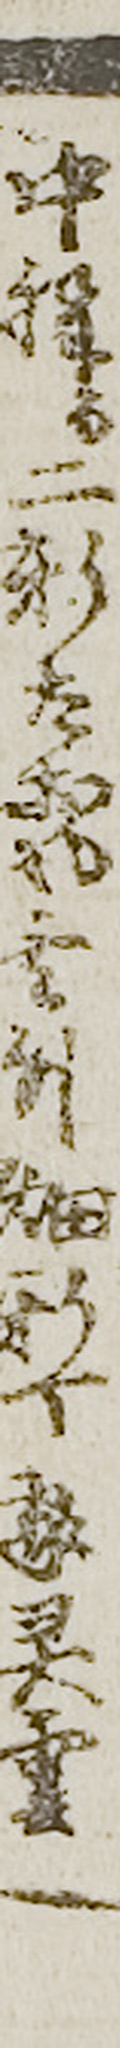中程二而二軒たおれ其外畑新丁家灵雲
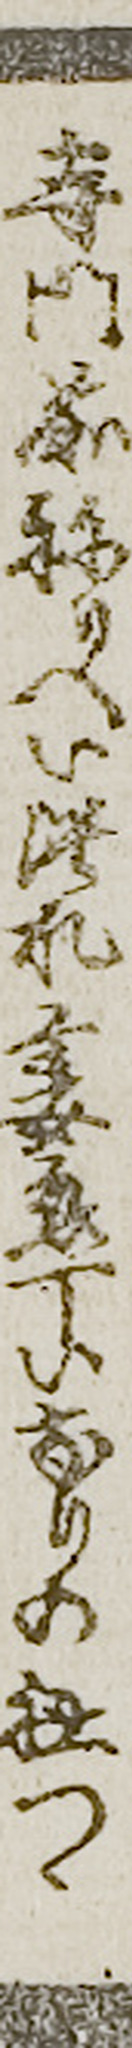寺門前ねりへい潰れ妻恋丁いなりの社つゝ
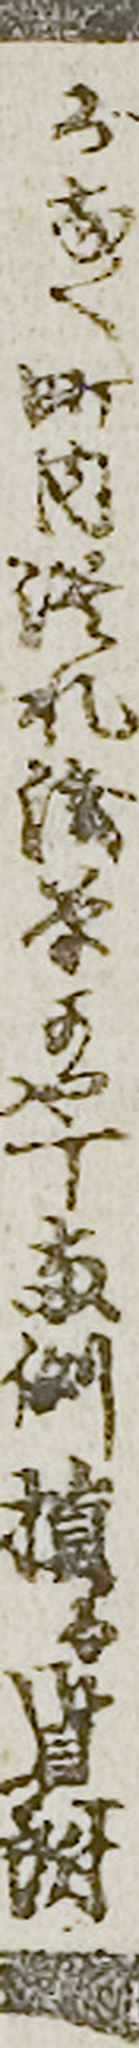がなく町内潰れ浅草かや丁両側損る御目附
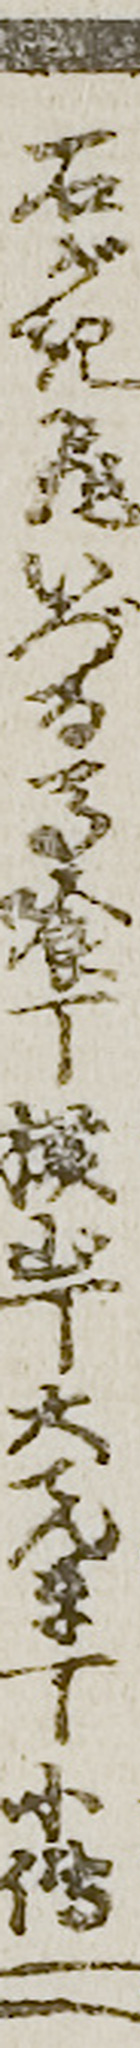いしがき飛いづる馬喰丁横山丁大てんま丁小伝
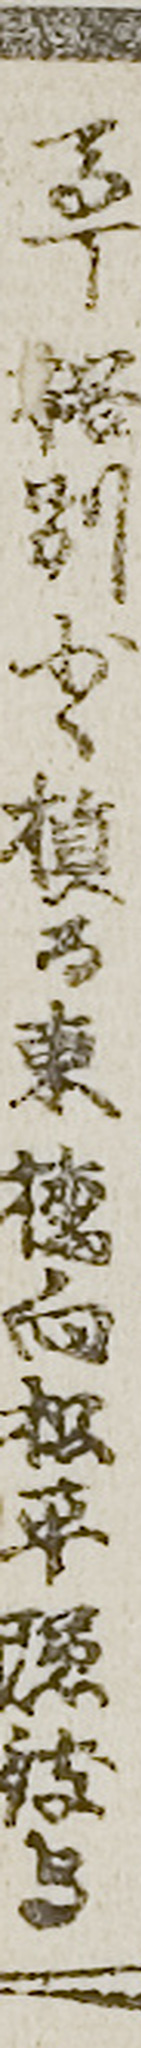馬丁格別少々損る東橋向松平隠岐守
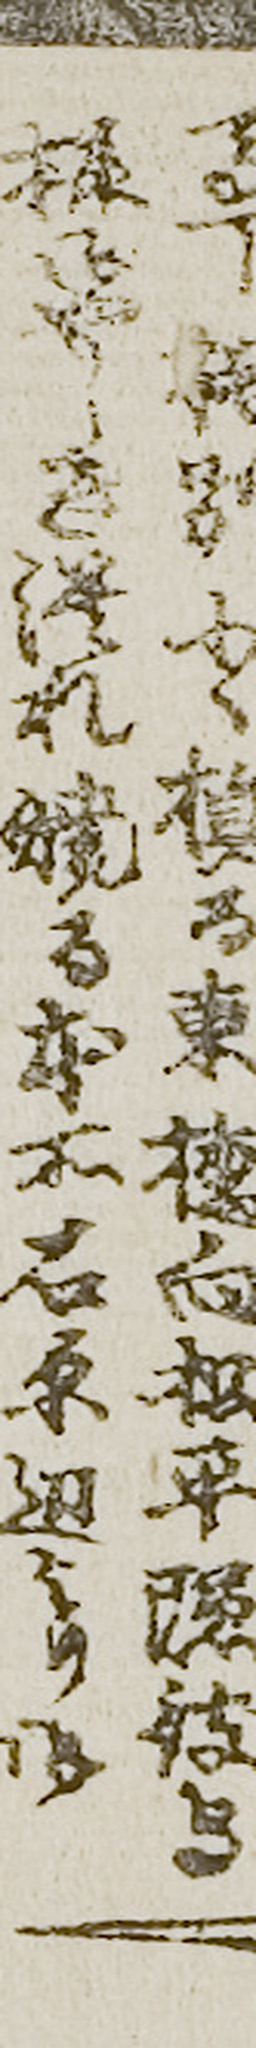様おやしき潰れ焼る本所石原辺より御
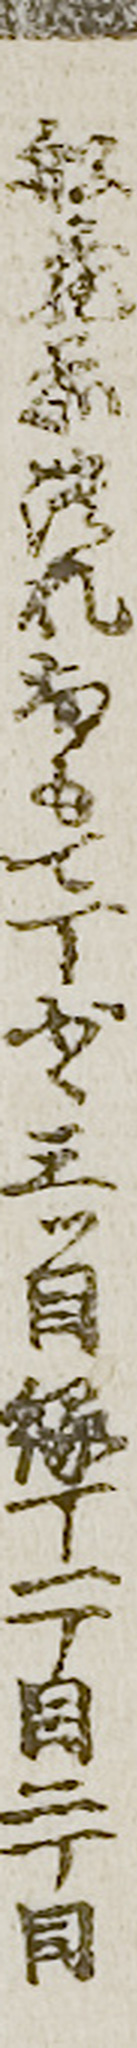船蔵前潰れおもて丁少々三ッ目緑丁一丁目二丁目
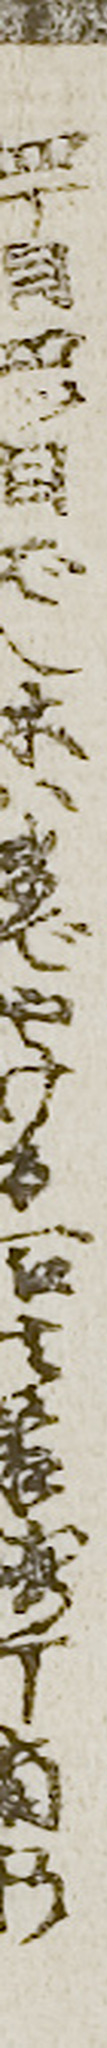四丁目四ッ目ばし木ハまでやける一口ハ丁南新
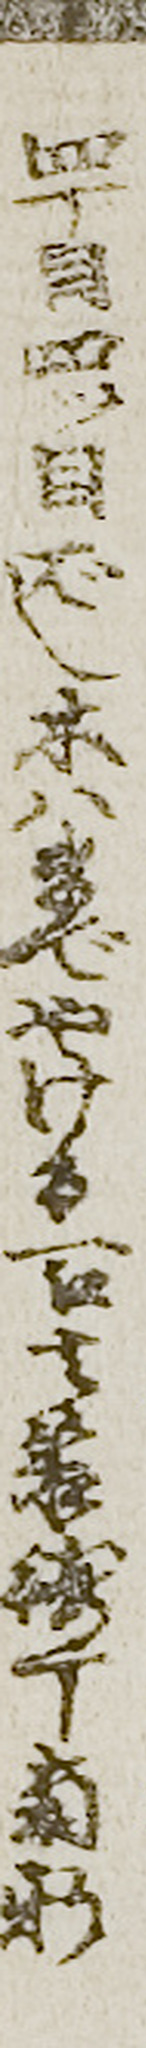四丁目四ッ目ばし木ハまでやける一口ハ丁南新
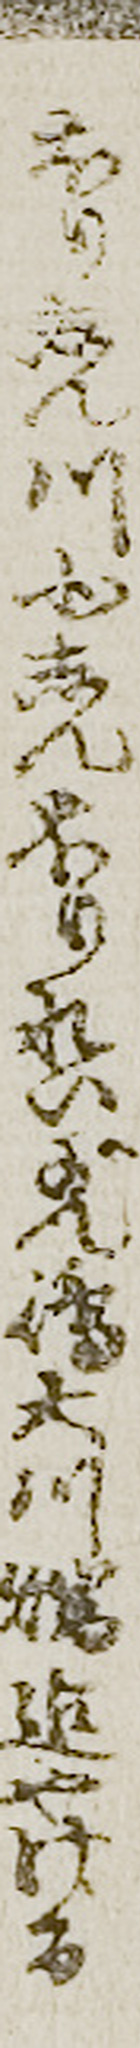ほりしん川しんほりれいがん嶋大川端迄やける
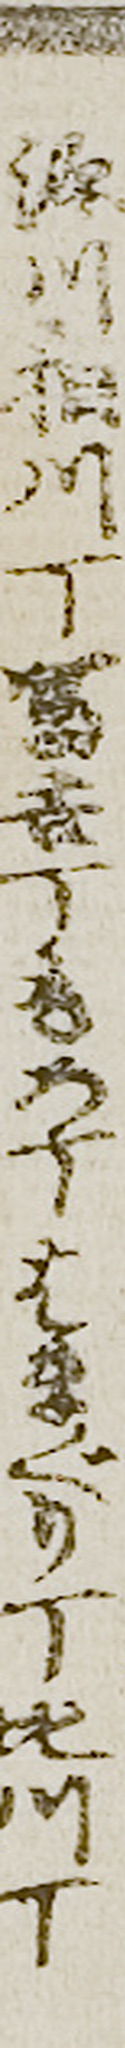深川相川丁冨吉丁もろ丁はまぐり丁比川丁
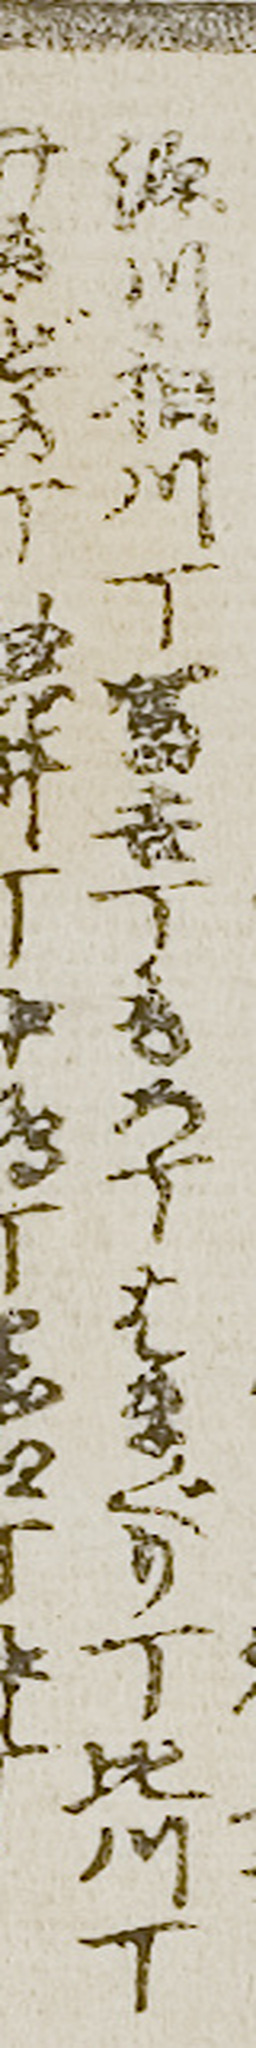けどの丁熊井丁中嶋丁黒江丁仲丁
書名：江戸大地震出火場所附
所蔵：東京大学総合図書館 General Library in the University of Tokyo, JAPAN
